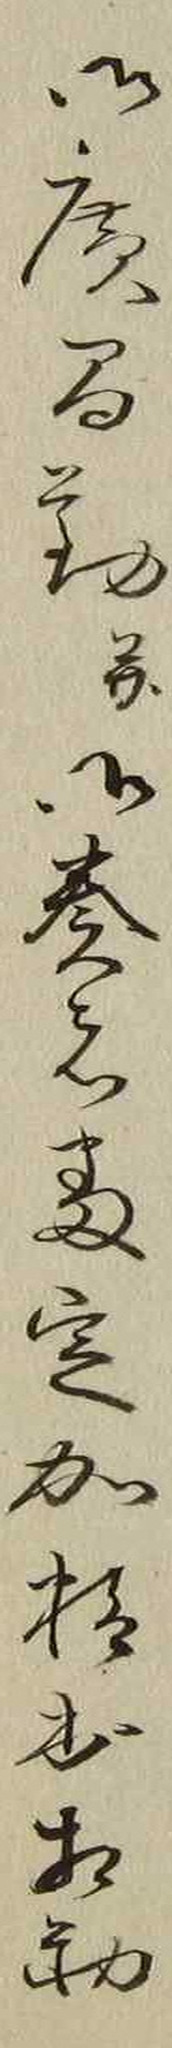御広間勤并御奏者番定加精出相勤
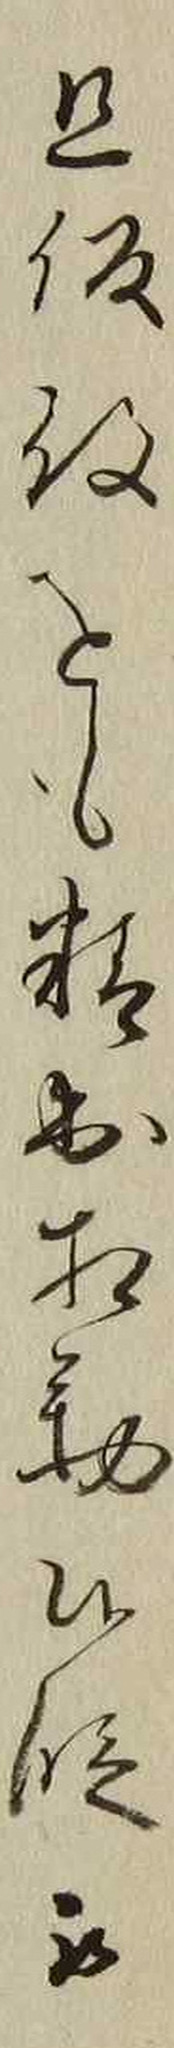且仮役をも精出相勤候段被
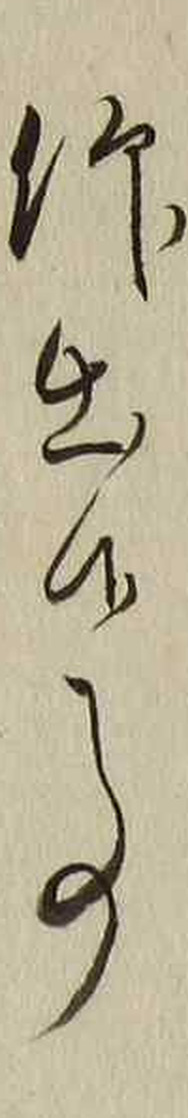仰出候事
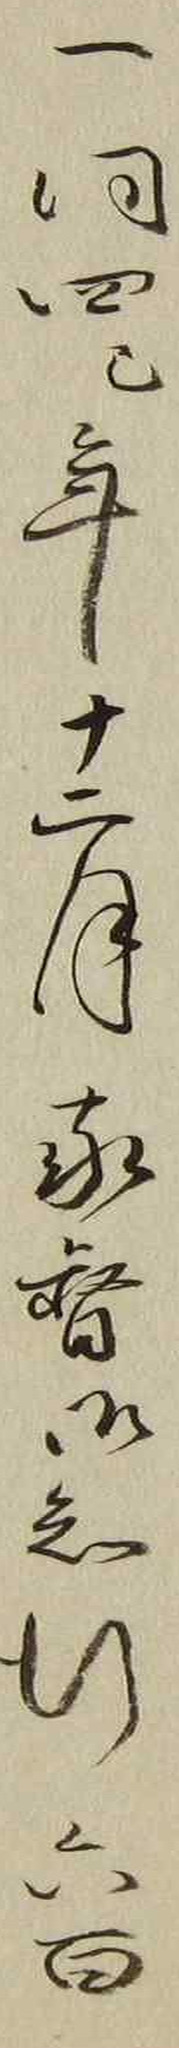一同四巳年十二月家督御知行六百
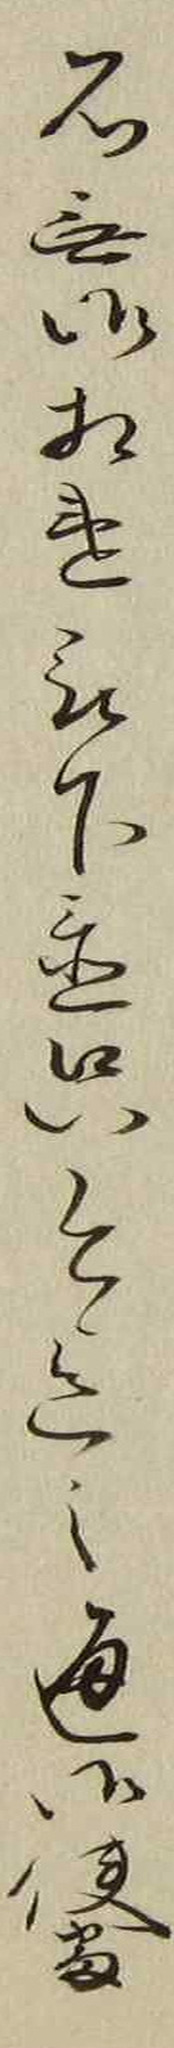石無御相違被下置只今迄之通御使番
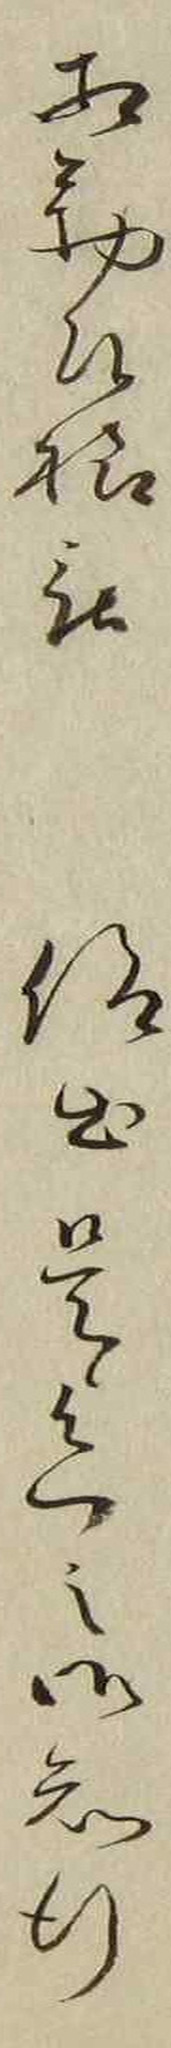相勤候様被仰出是迄之御知行
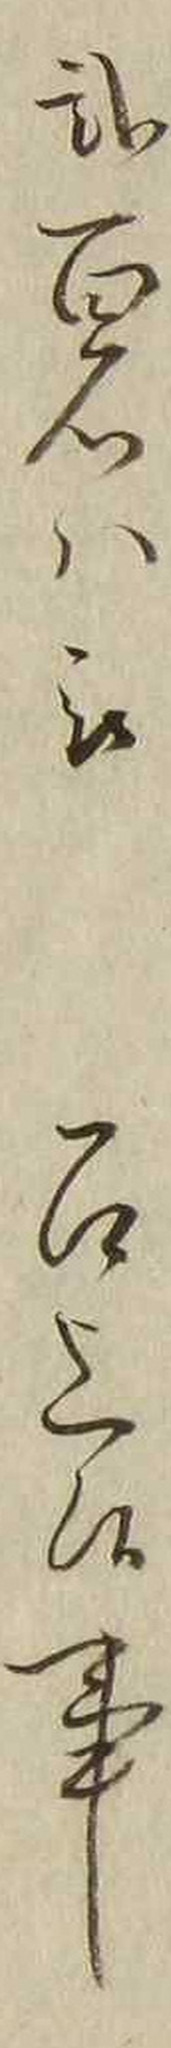弐百石ハ被召上候事

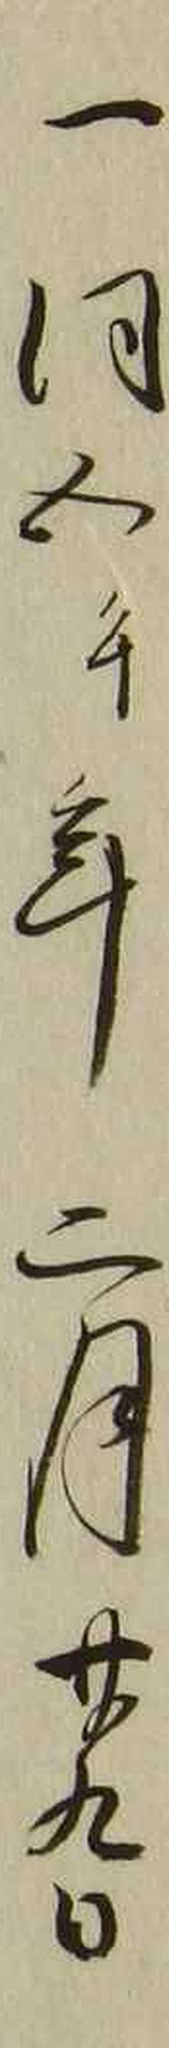一同五午年二月廿九日
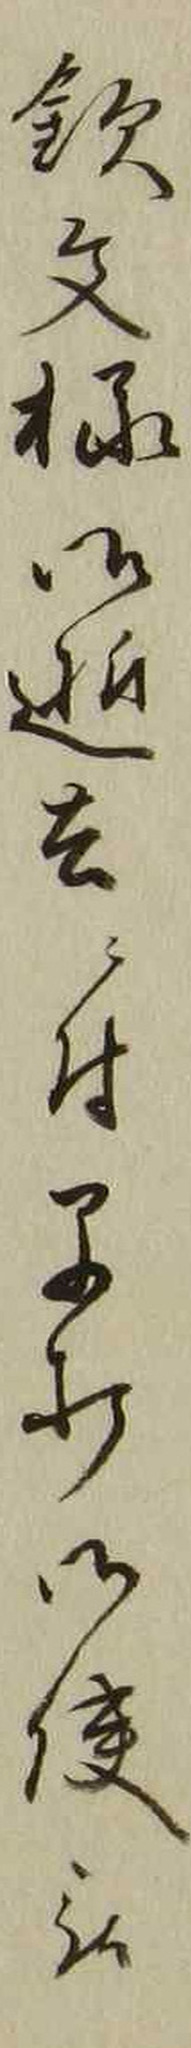欽文様御逝去ニ付早打御使被
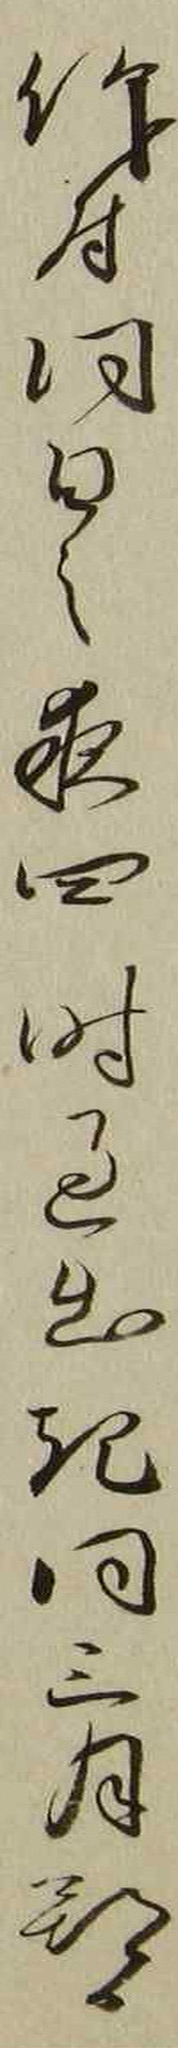仰付同日之夜四時過出起同三月朔日
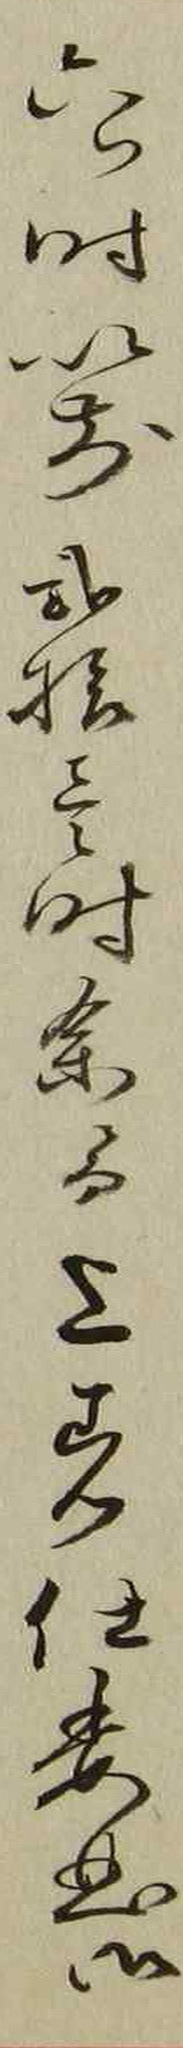六ツ時以前弐拾壱時余ニ而上着仕委曲御
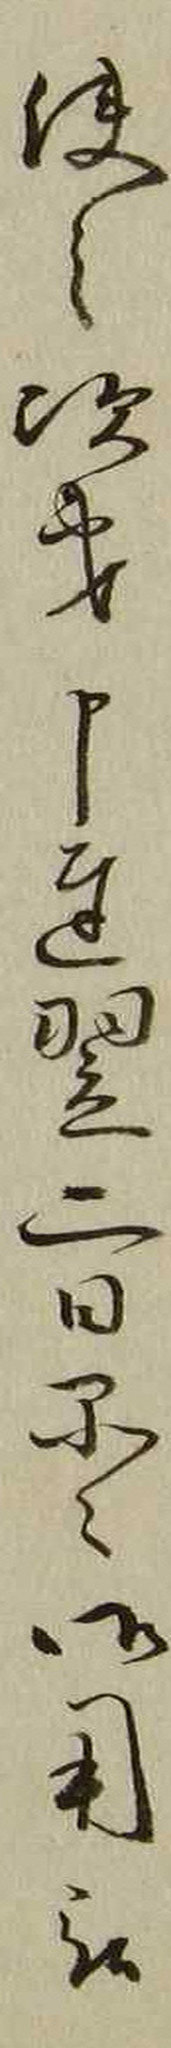使之次第申達翌二日早々御用被
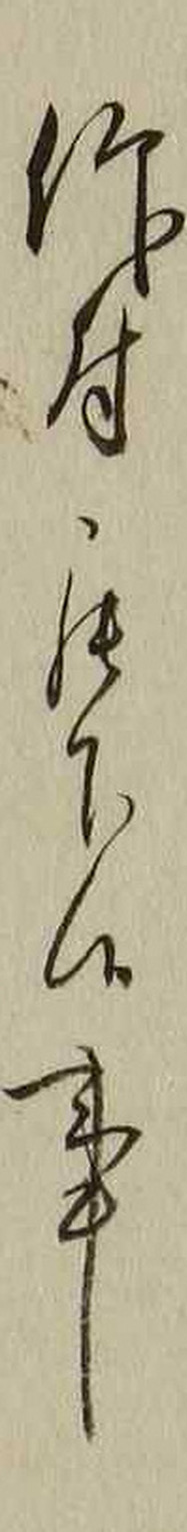仰付罷下候事
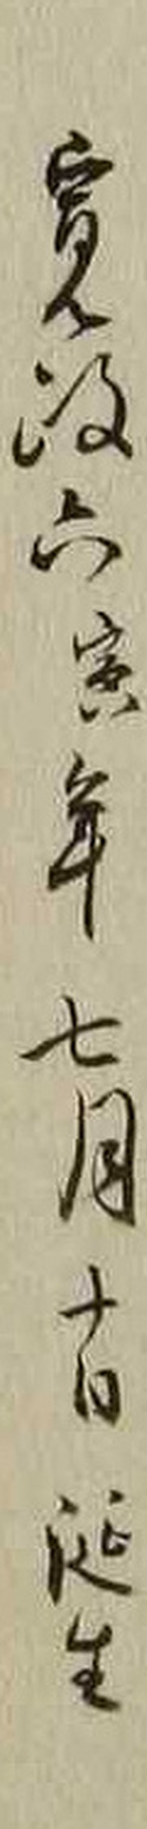寛政六寅年七月十日誕生
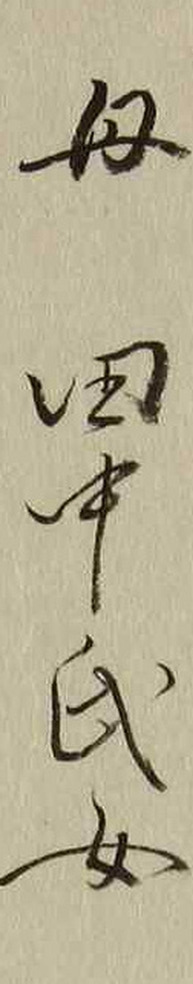母田中氏女
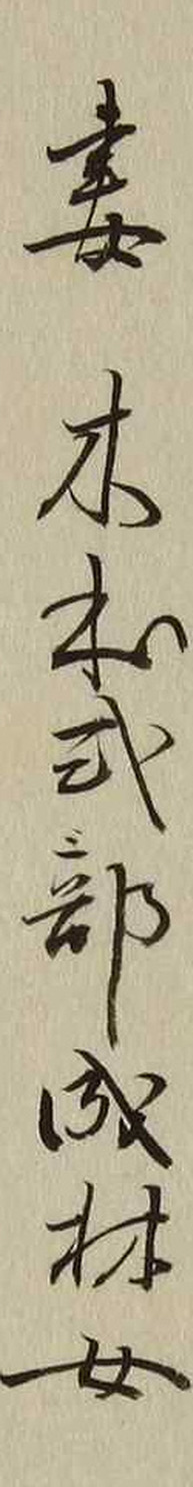妻木本式部成林女
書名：諸士系譜　巻之2　い之部2
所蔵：会津若松市立会津図書館
